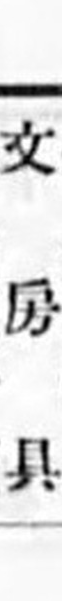文房具
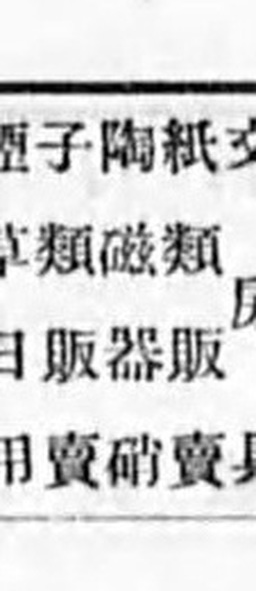陶磁器硝
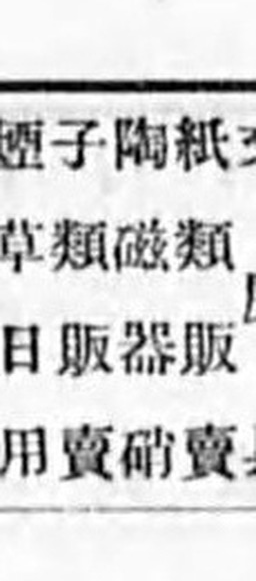陶磁器硝
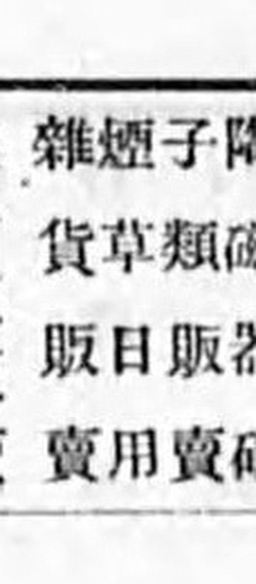煙草日用

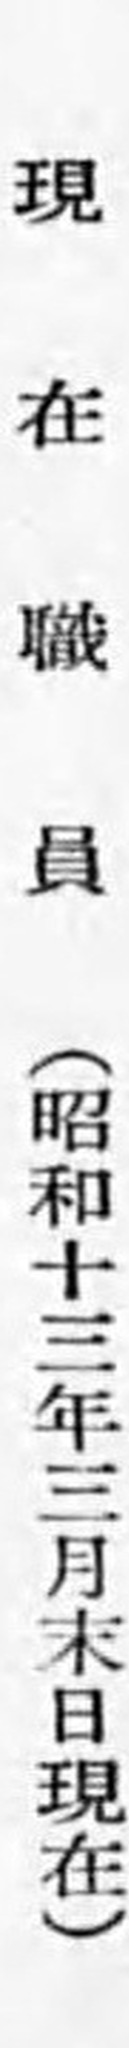現在職員(昭和十三年三月末日現在)
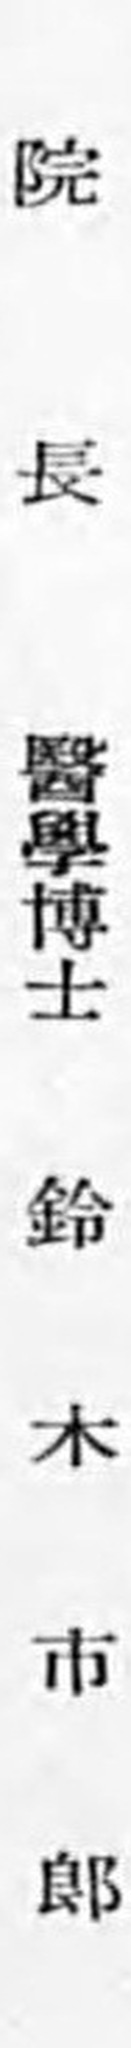院長医学博士鈴木市郎
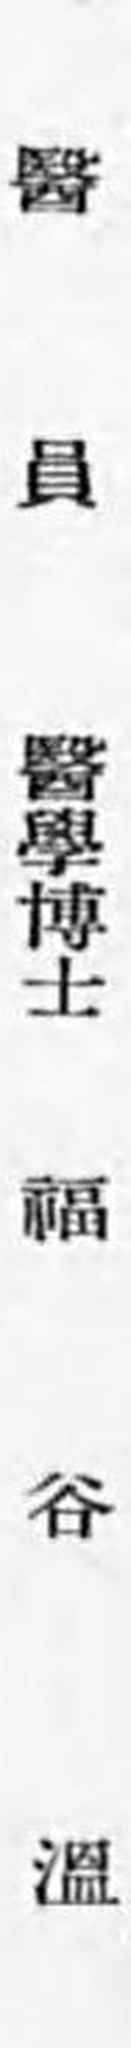医員医学博士福谷温
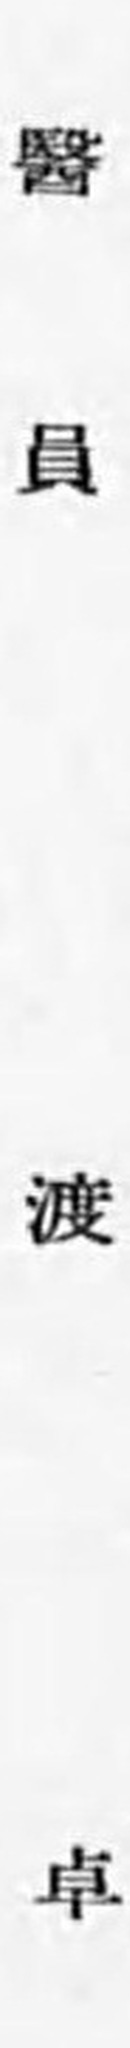医員渡卓
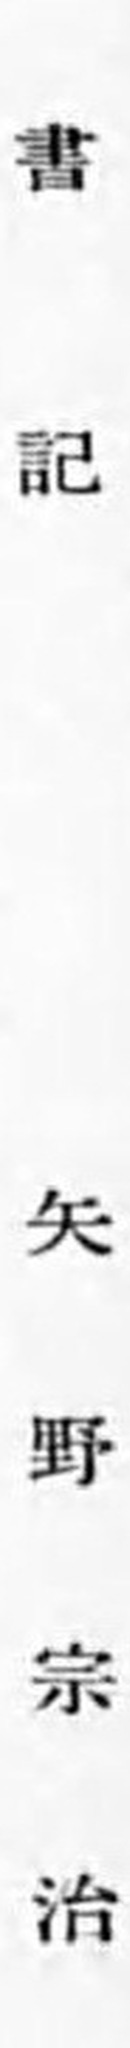書記矢野宗治
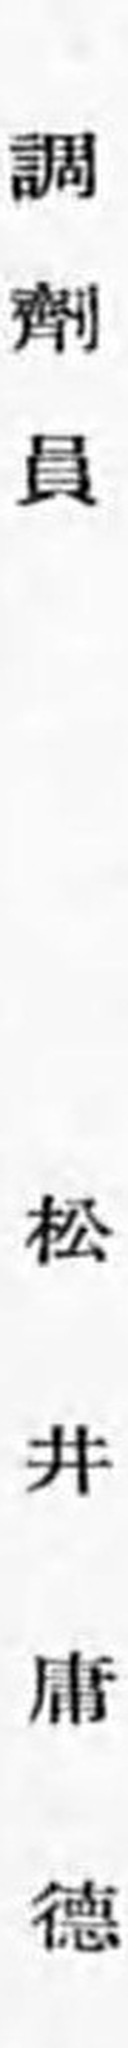調剤員松井庸徳
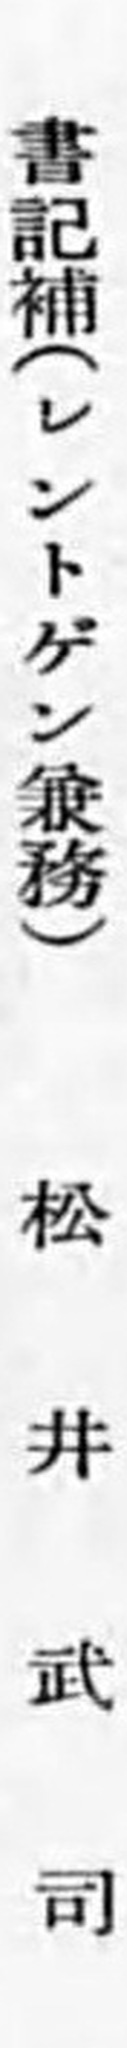書記補(レントゲン兼務)松井武司
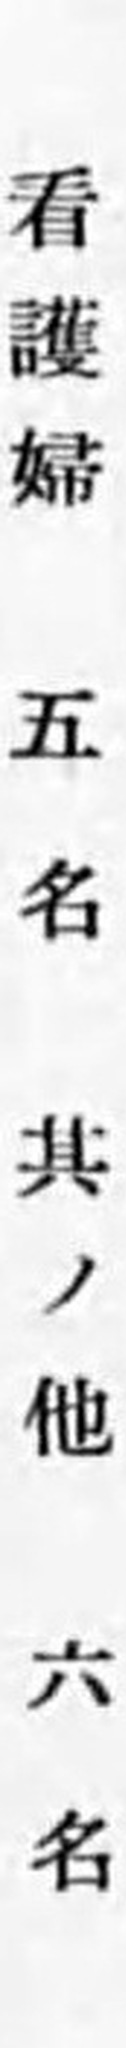看護婦五名其ノ他六名
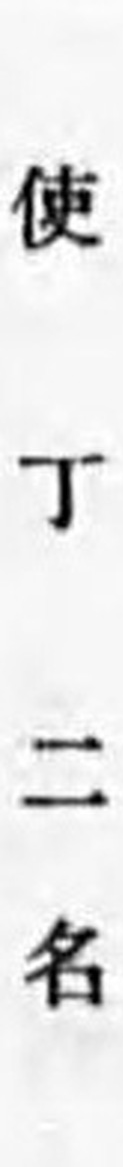使丁二名

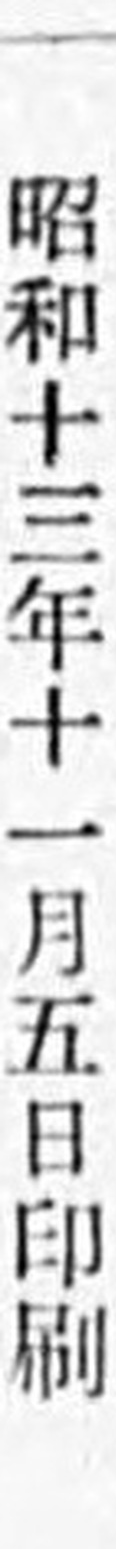昭和十三年十一月五日印刷
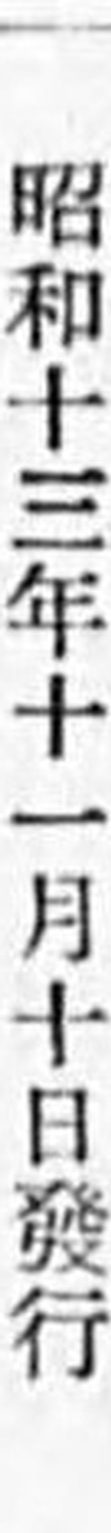昭和十三年十一月十日発行
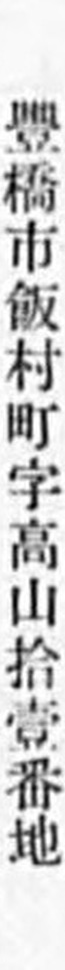豊橋市飯村町字高山拾壱番地
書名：豊橋市立高山病院年報. 昭和12年度
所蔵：国立国会図書館 National Diet Library, JAPAN
